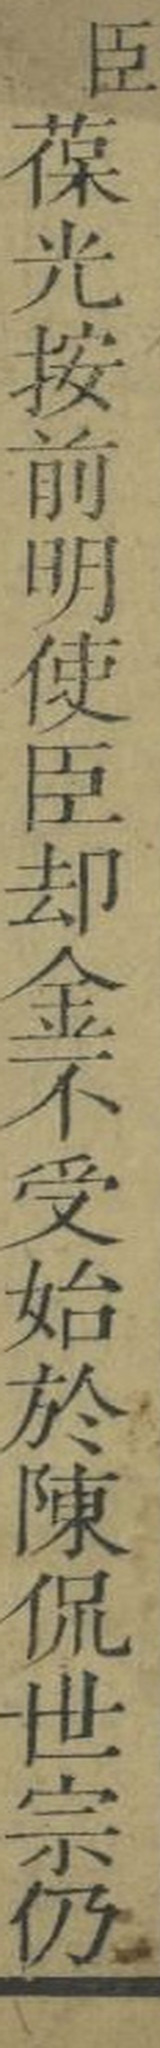臣葆光按前明使臣却金不受始於陳侃世宗仍
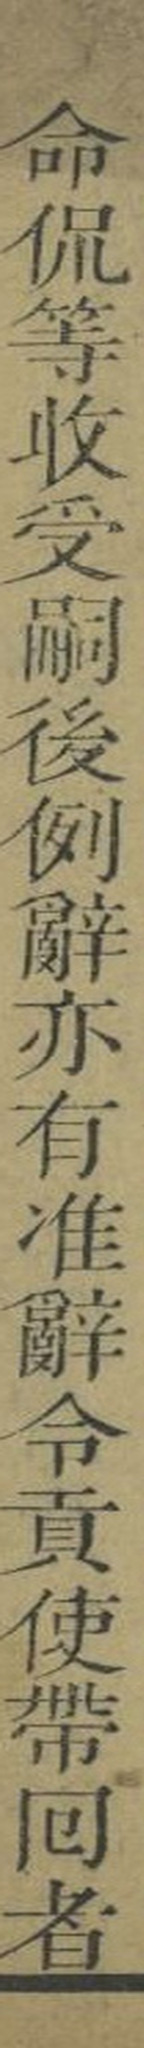命侃等收受嗣後例辭亦有准辭令貢使帶囘者
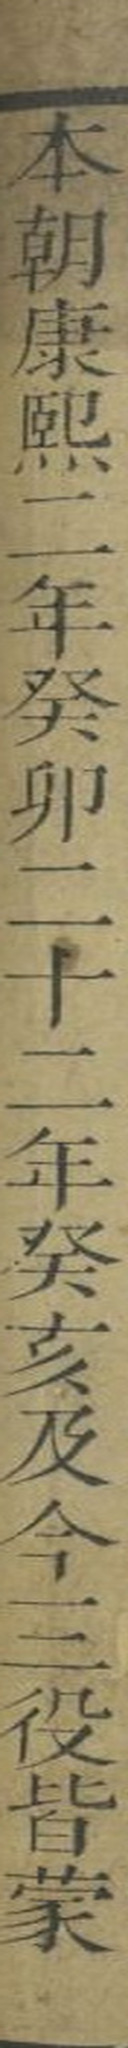本朝康熙二年癸卯二十二年癸亥及今三役皆蒙
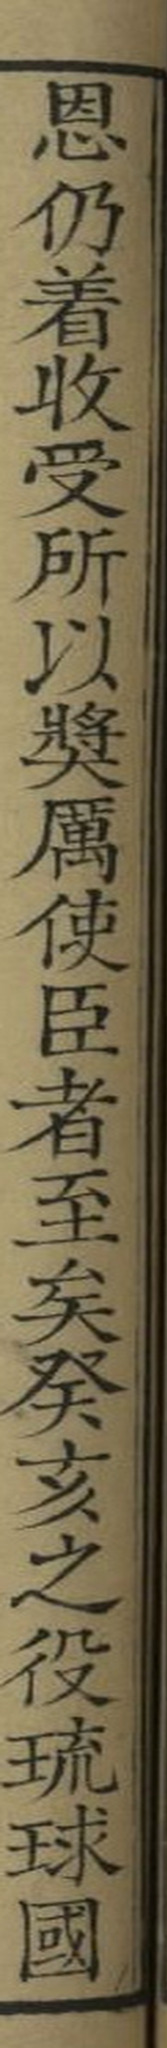恩仍着收受所以奬厲使臣者至矣癸亥之役琉球國
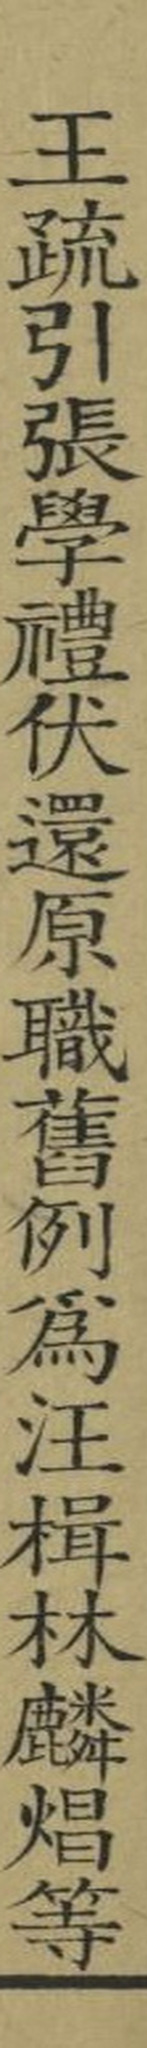王疏引張學禮伏還原職舊例爲汪楫林麟焻等
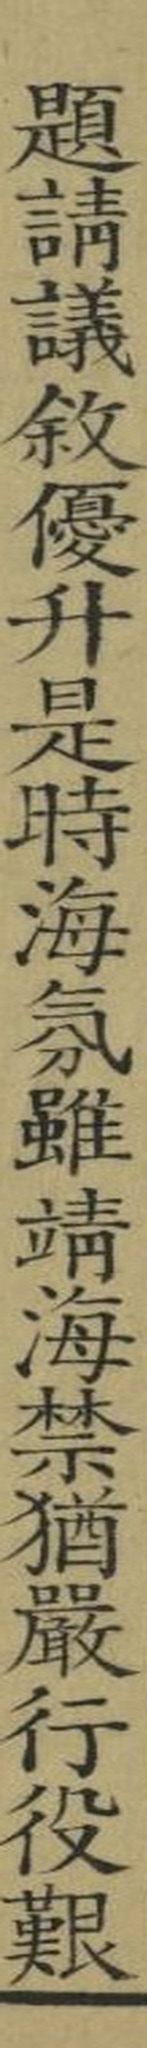題請議敘優升是時海氛雖靖海禁猶嚴行役艱
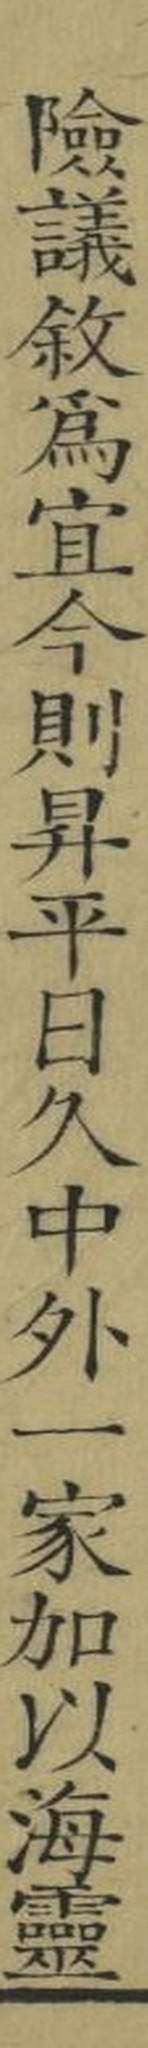險議敘爲宜今則昇平日久中外一家加以海靈
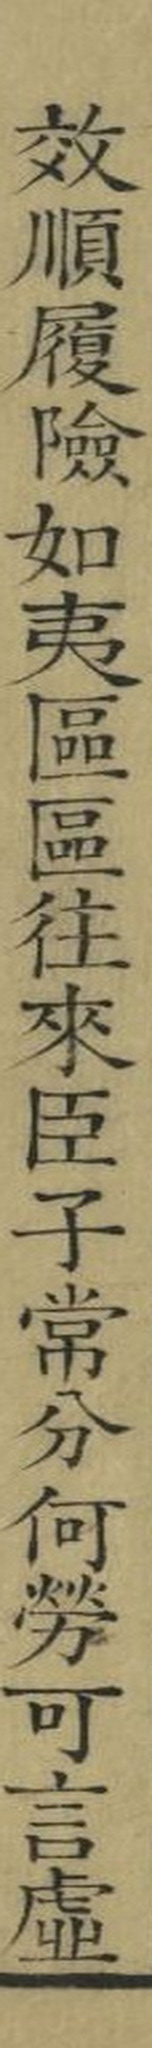效順履險如夷區區往來臣子常分何勞可言虛
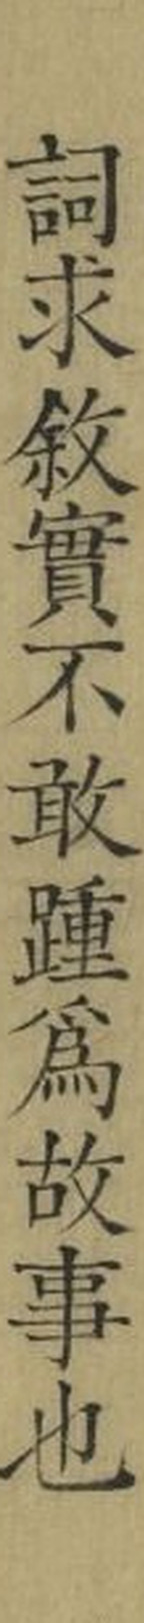詞求敘實不敢踵爲故事也

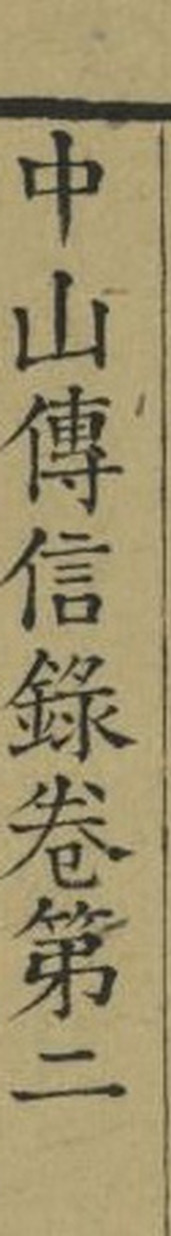中山傳信錄卷第二
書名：中山伝信録 巻二
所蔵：University of the Ryukyus Library
